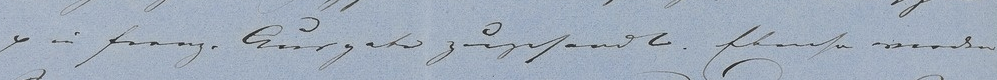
& in franz. Ausgabe zugesandt. Ebenso werden
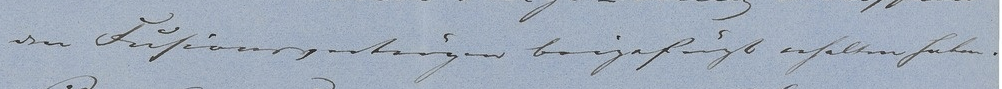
den Fusionsverträgen beigefügt erhalten haben.
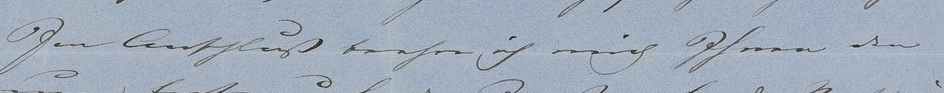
Im Anschluß beehre ich mich Ihnen den
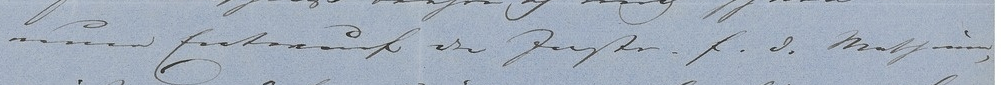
neuen Entwurf der Instr. f. d. Maschninen-
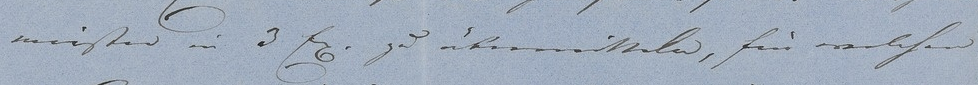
meister in 3 Ex. zu übermitteln, für welchen
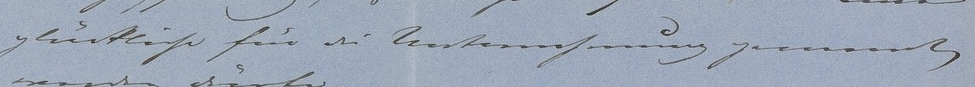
glückliche für die Unternehmung genannt
